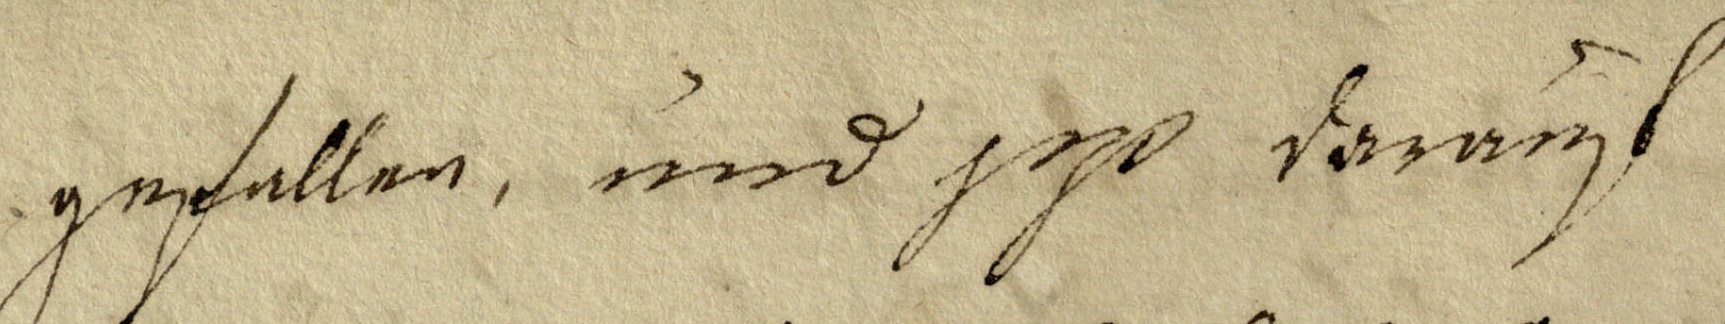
gefallen, und jezo darauf
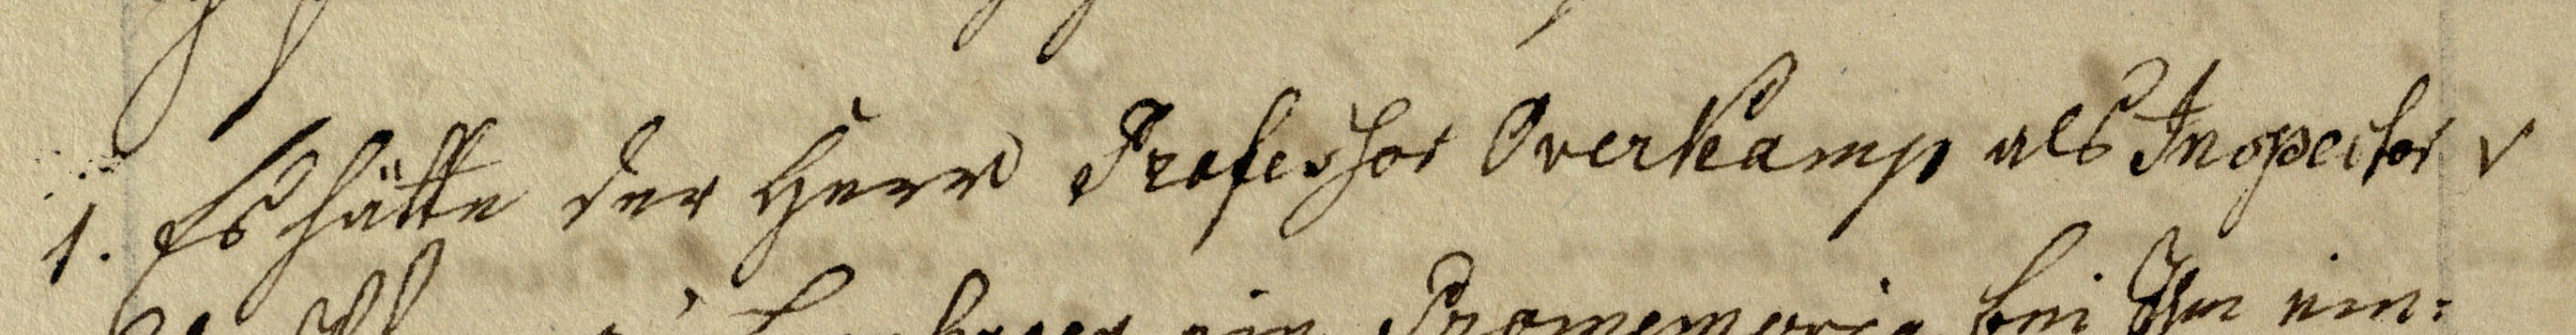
1. Es hätte der Herr Professor Overkamp als Inspector
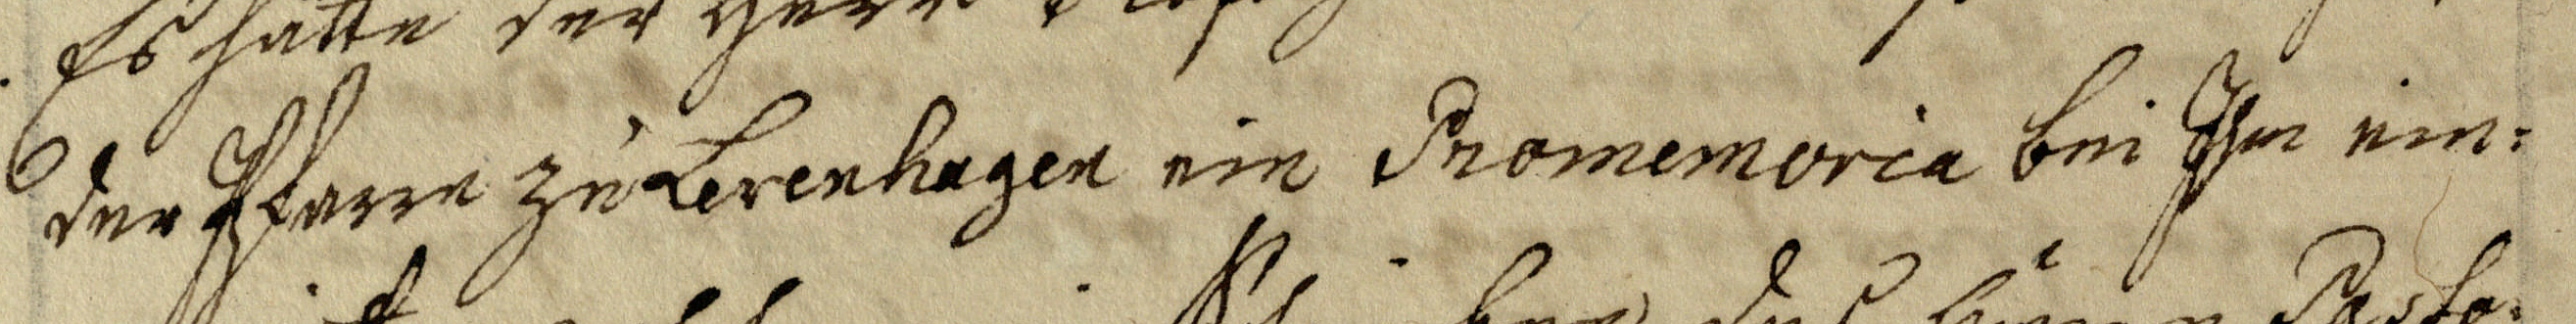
der Pfarre zu Levenhagen ein Promemoria bei Ihm ein¬
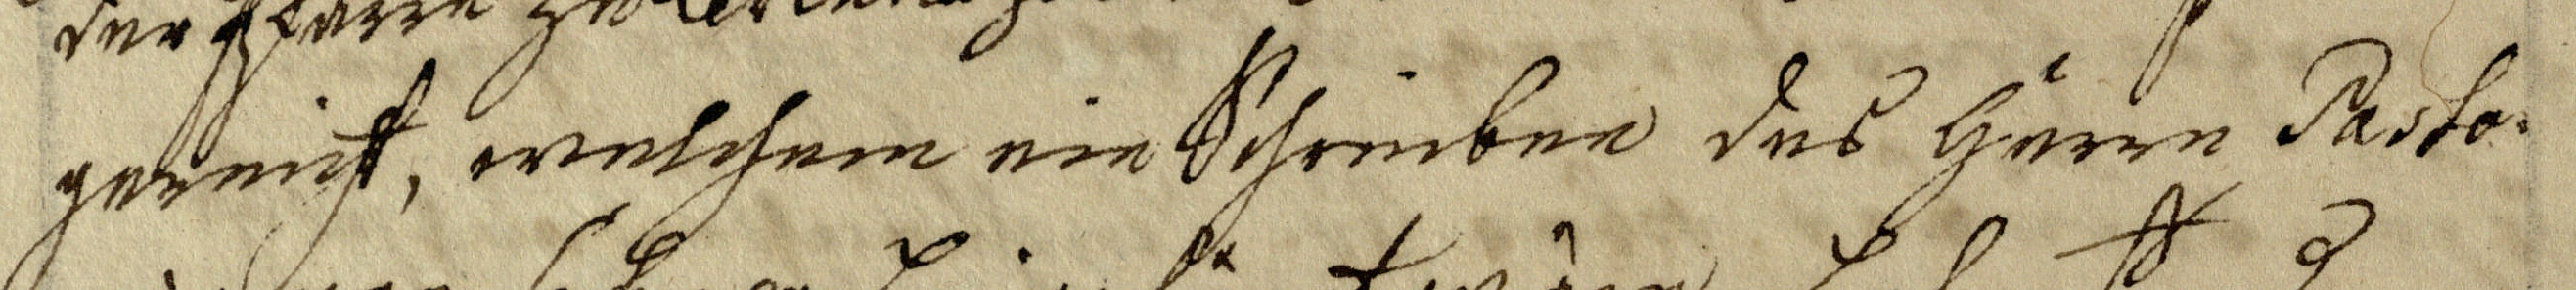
gereicht, welchem ein Schreiben des Herrn Pasto¬
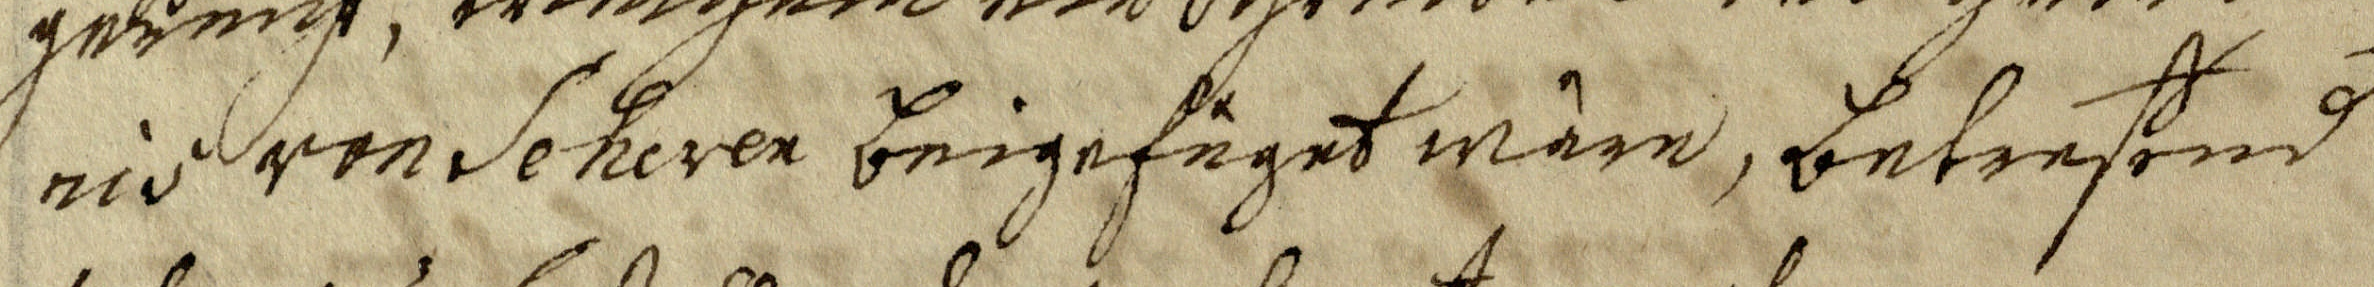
ris von Scheven beigefüget wäre, betreffend
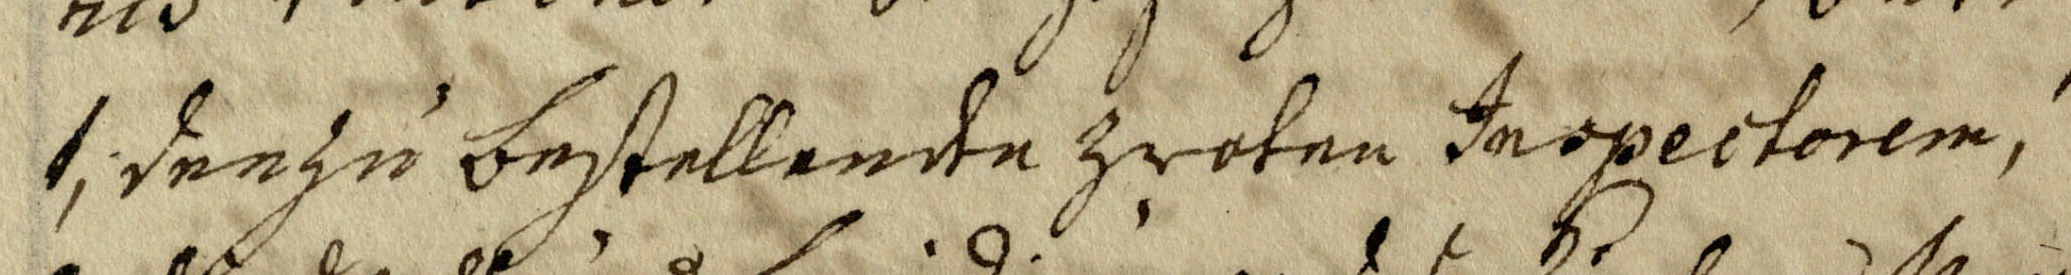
1, den zu bestellenden zwoten Inspectorem,
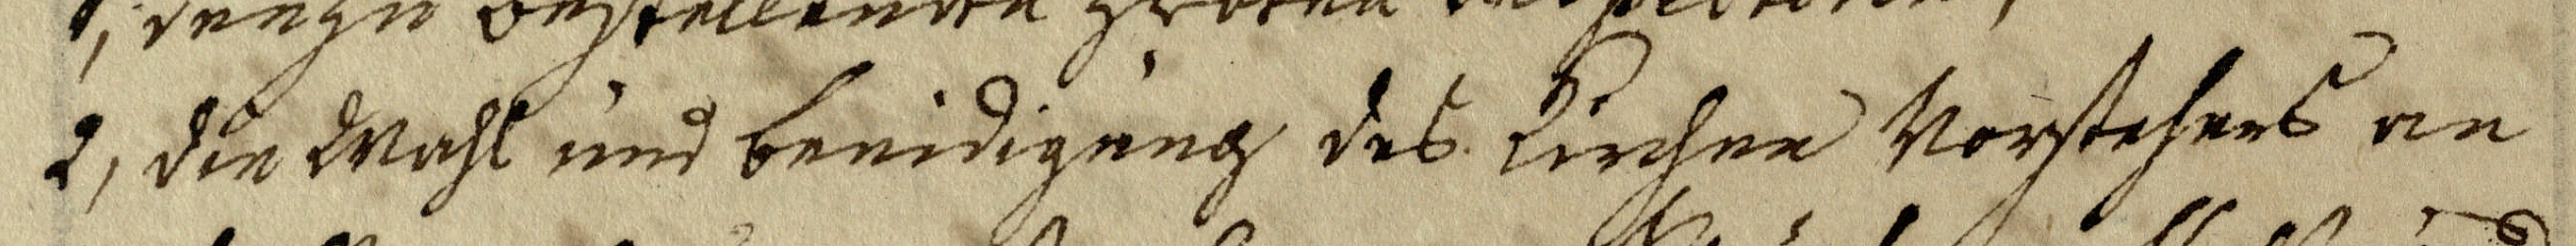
2, die Wahl und Beeidigung des Kirchen Vorstehers an
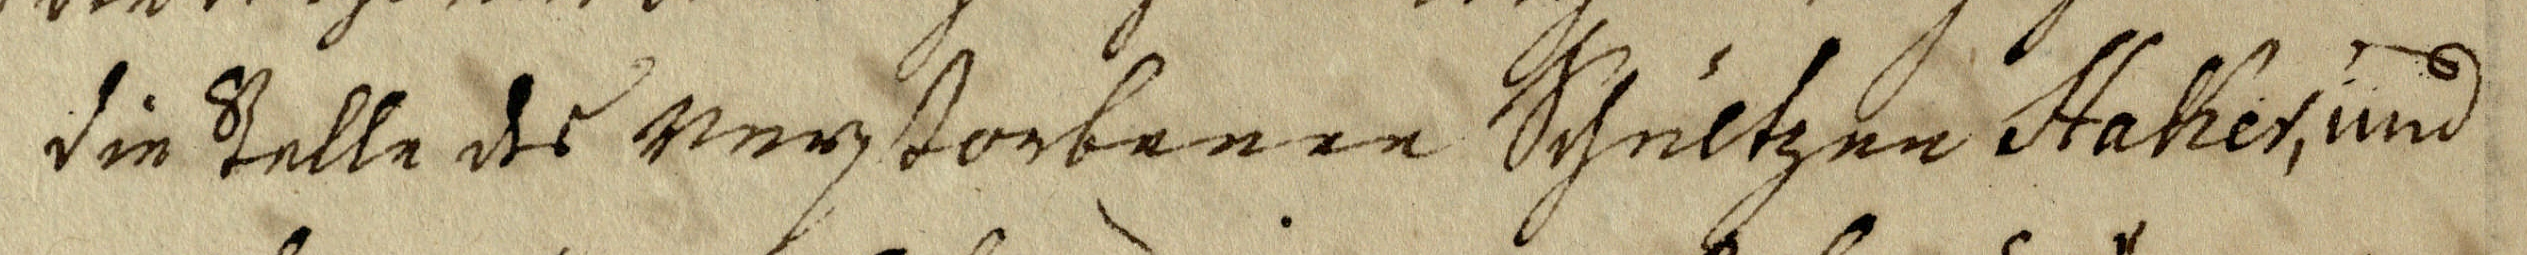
die Stelle des verstorbenen Schultzen Haker, und
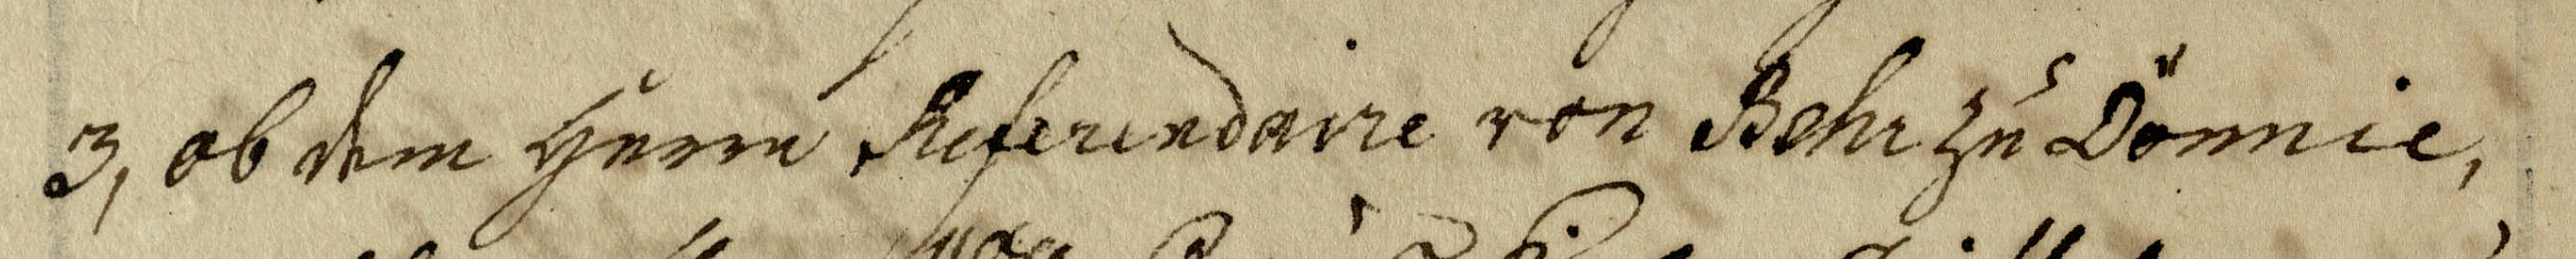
3, ob dem Herrn Referendaire von Behr zu Dönnie,
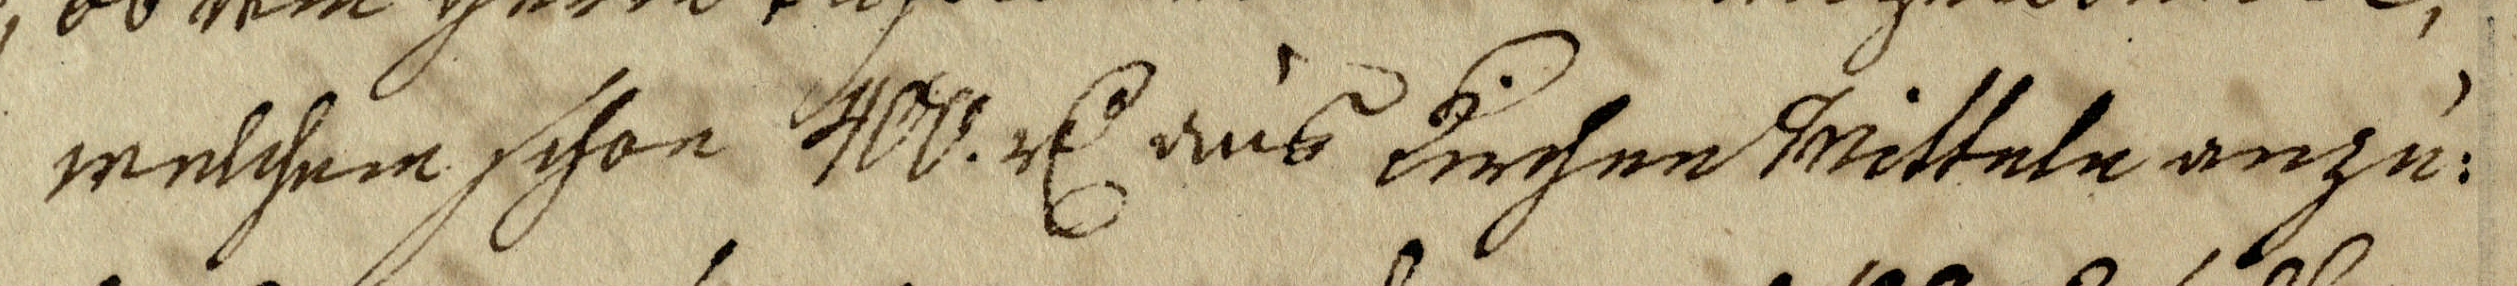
welchem schon 400. r. aus Kirchen Mitteln anzu¬
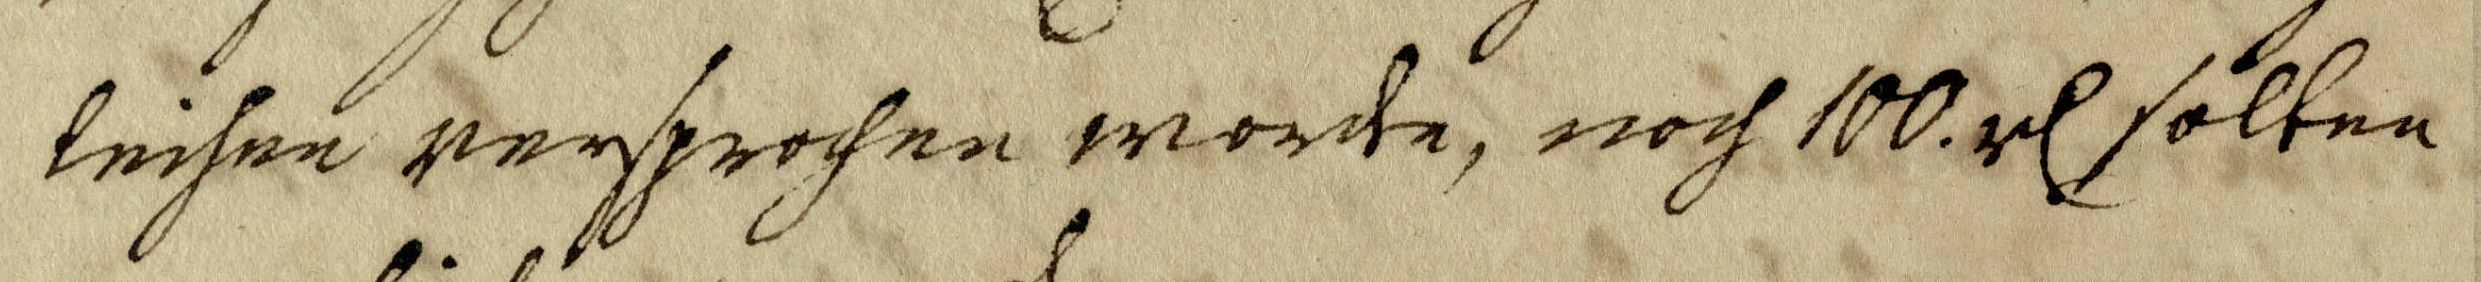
leihen versprochen worden, noch 100. rt solten
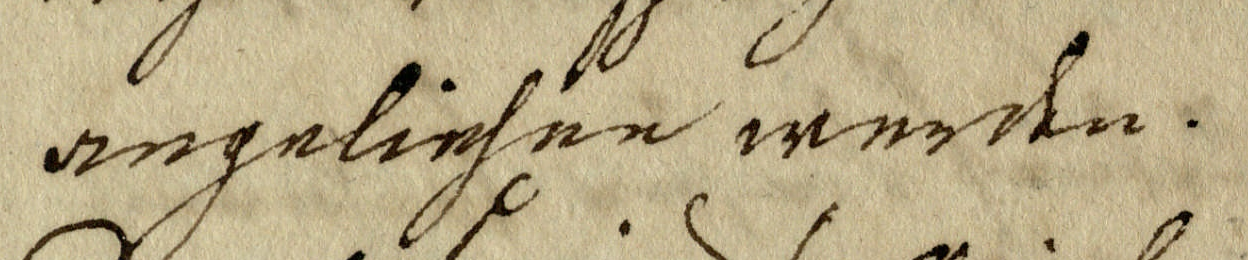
angeliehen werden.
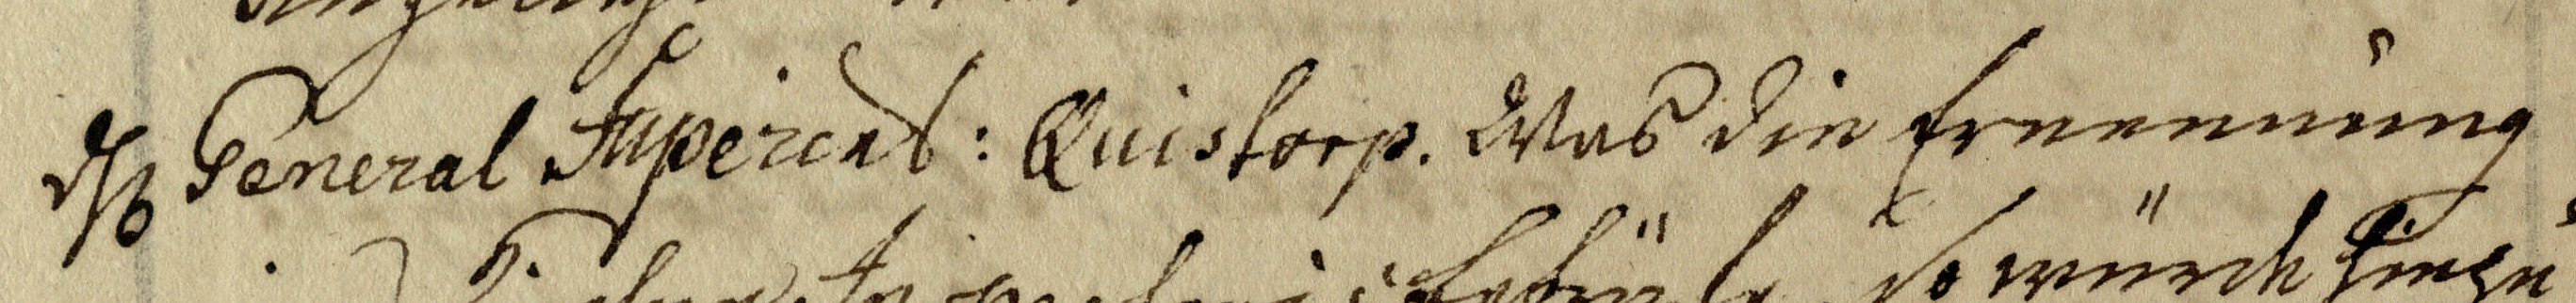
dh General Superint. Quistorp. Was die Ernennung
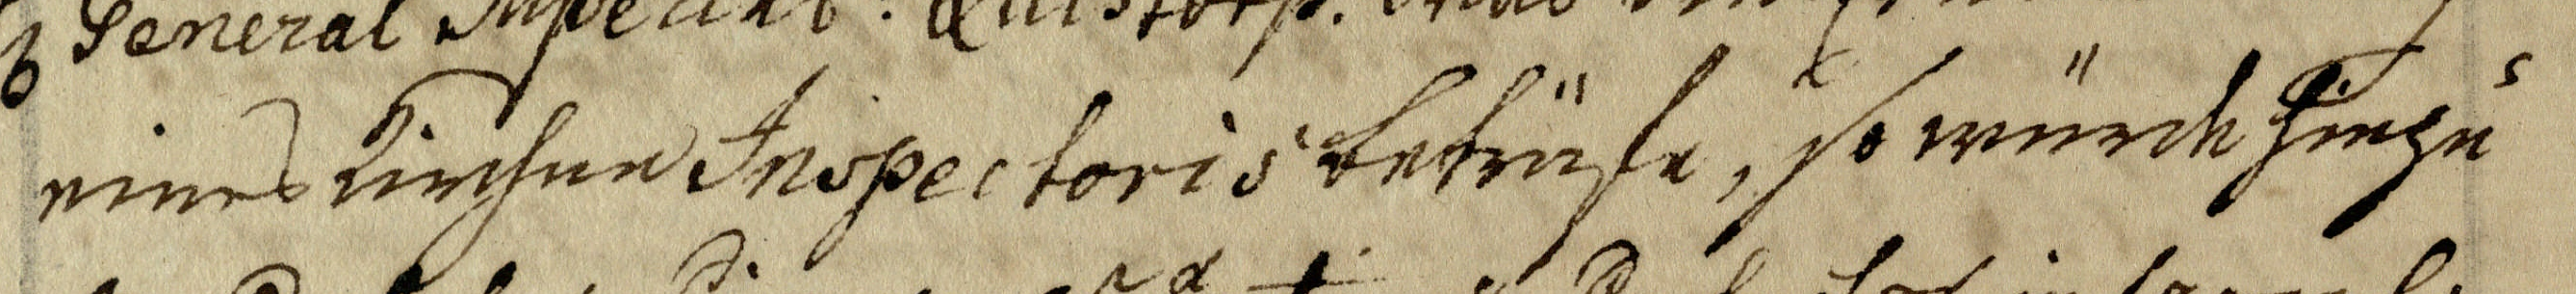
s Kirchen Inspectoris beträfe, so würde hiezu
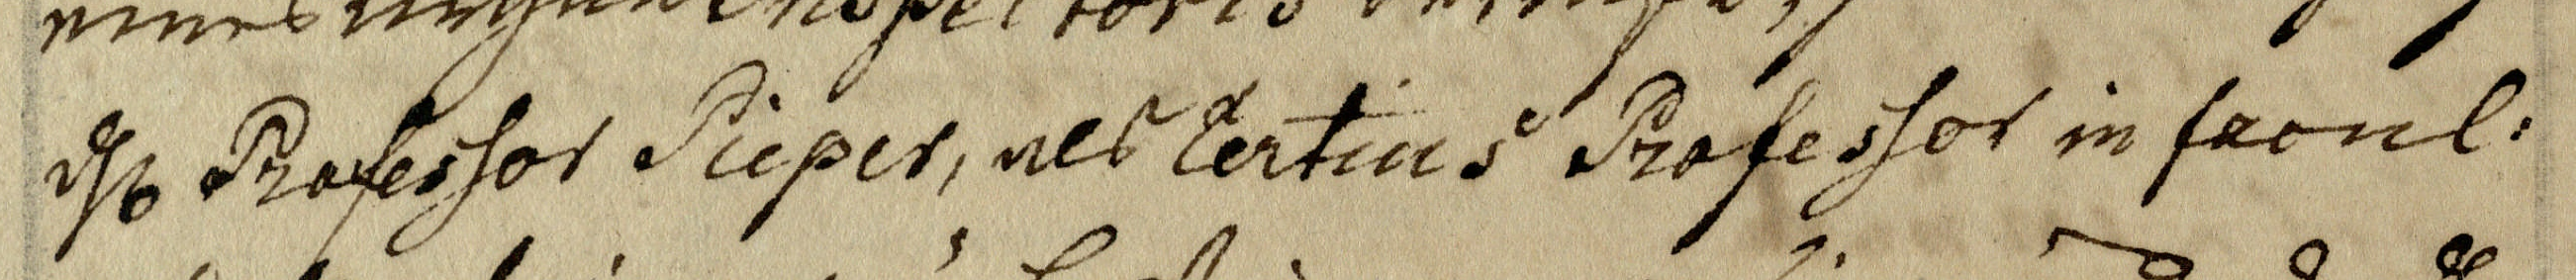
dh Professor Pieper, als tertius Professor in facul¬
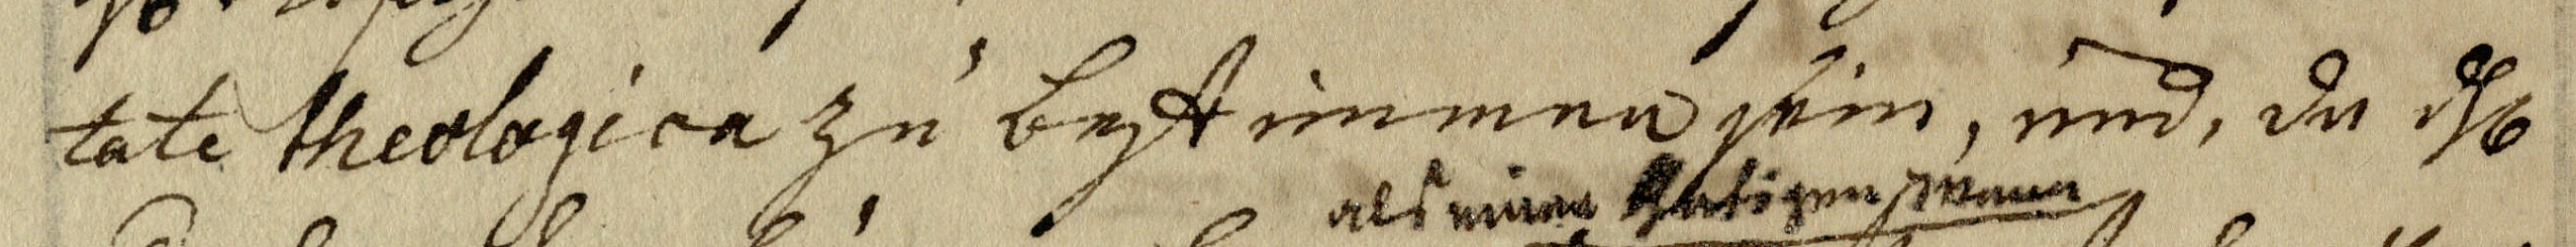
tate theologica zu bestimmen sein, und, da dh
